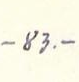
83.
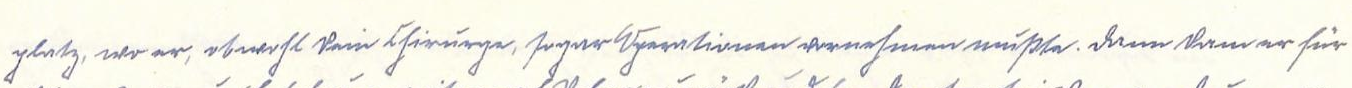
glatz, wo er, obwohl kein Chirurge, sogar Oerationen vornehmen musste. Dann kam er für
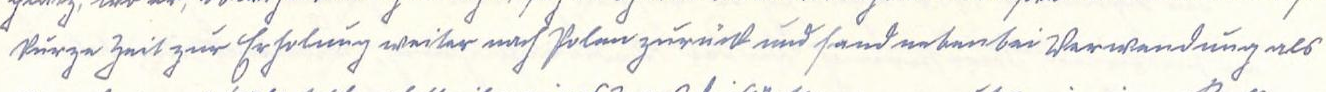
kurze Zeit zur Erholung weiter nach Polen zurück und fand nebenbei Verwendung als
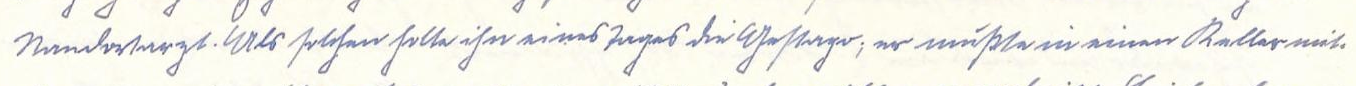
Standortarzt. Als solchen holte ihn eines Tages die Gestapo; er muste in einen Keller mit-
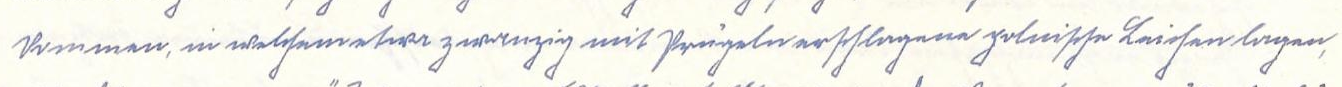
kommen, in welchem etwa zwanzig mit Prügeln erschlagene polnische Leichen lagen,
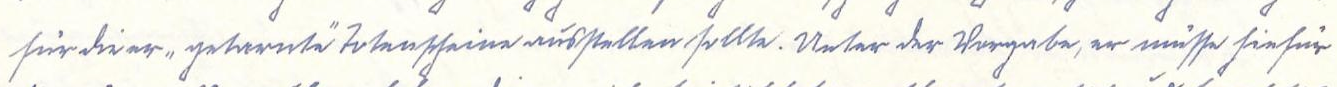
für die er getarnte Totenscheine ausstellen sollte. Unter der Vorgabe, er müsse hiefür
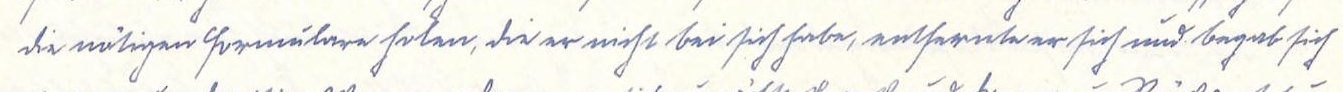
die nötigen Formulare holen, die er nicht bei sich habe, entfernte er sich und begab sich
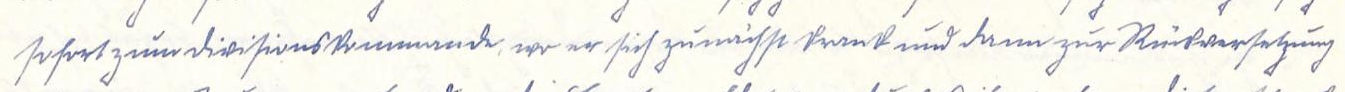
sofort zum Divisionskommando, wo er sich zunächst krank und dann zur Rückversetzung
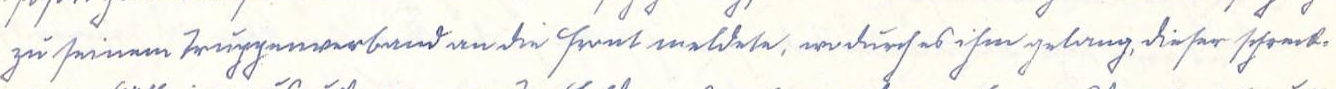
zu seinem Truppenerband an die Front meldete, wo durch es ihm gelang, dieser schreck-
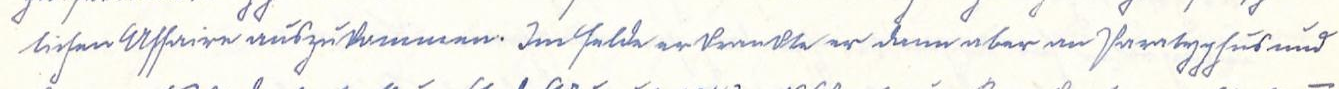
lichen Affaire auszukommen- Im Felde erkrankte er dann aber an Paratyphus und
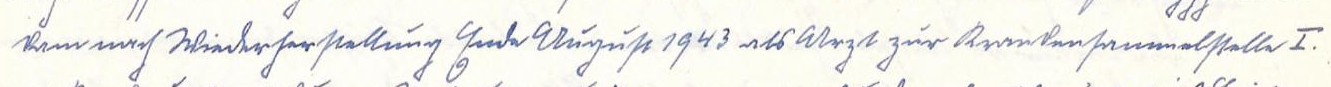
kam nach Wiederherstellung Ende August 1943 als Arzt zur Krankensammelstelle I.
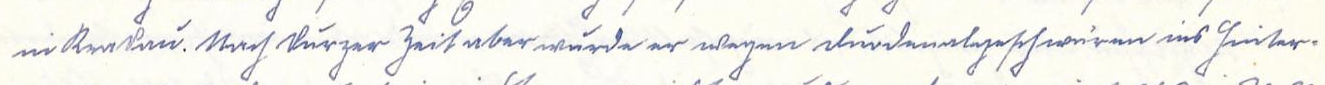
in Krakau. Nach kurzer Zeit aber wurde er wegen Duodenalegeschwüren ins Hinter-
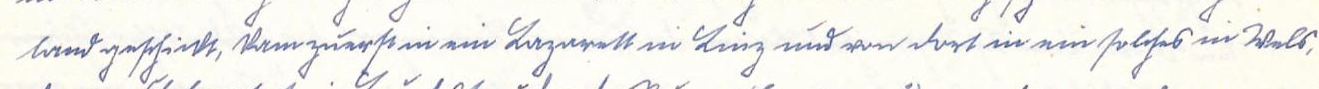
land geschickt, kam zuerst in ein Lazarett in Linz und von dort in ein solches in Wels,
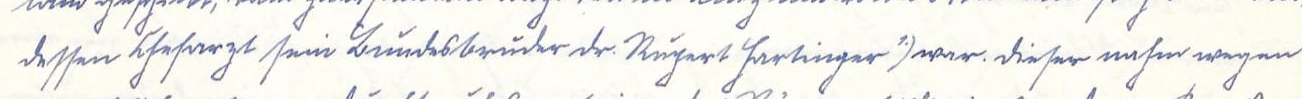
dessen Chefarzt sein Bundesbruder Dr. Rupert Hartinger war. Dieser nahm wegen
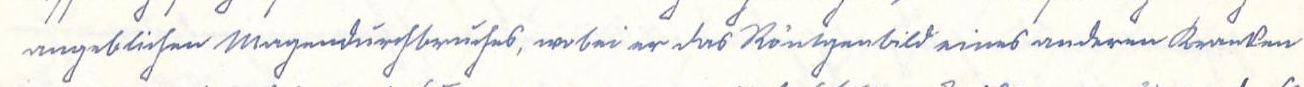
angeblichen Magendurchbruches, wobei er das Röntgenbild eines anderen Kranken
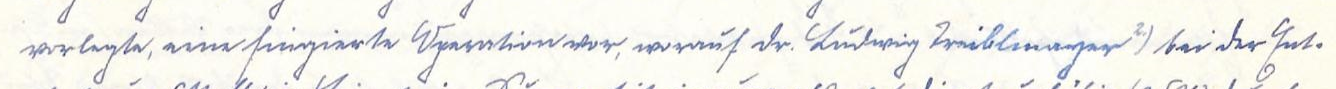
vorlegte, eine fingierte Oeration vor, worauf Dr. Ludwig Treiblmayer 2) bei der Ent-
